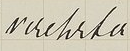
verehrter
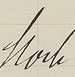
Herr
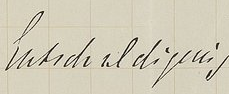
Entschuldigung
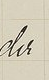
Ihren
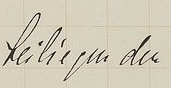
der beiliegenden
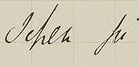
heute über-
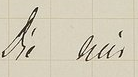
von Bern
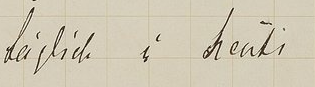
Die mir zugesandten
